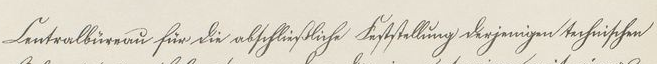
Centralbüreau für die abschließliche Feststellung derjenigen technischen
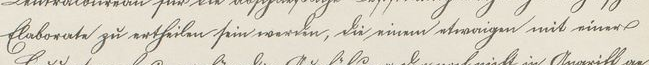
Elaborate zu ertheilen sein werden, die einem etwaigen mit einer
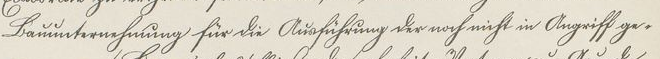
Bauunternehmung für die Ausführung der noch nicht in Angriff ge-
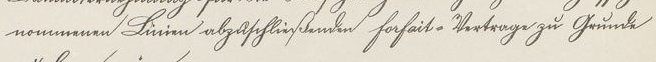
nommenen Linien abzuschließenden forfait-Vertrage zu Grunde
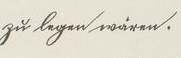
zu legen wären.
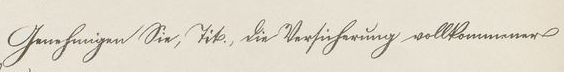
Genehmigen Sie, Tit., die Versicherung vollkommener
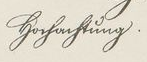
Hochachtung.
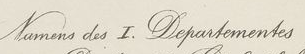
Namens des I. Departementes
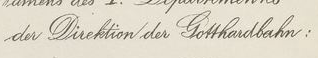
der Direktion der Gotthardbahn:
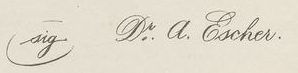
sig Dr A. Escher.
